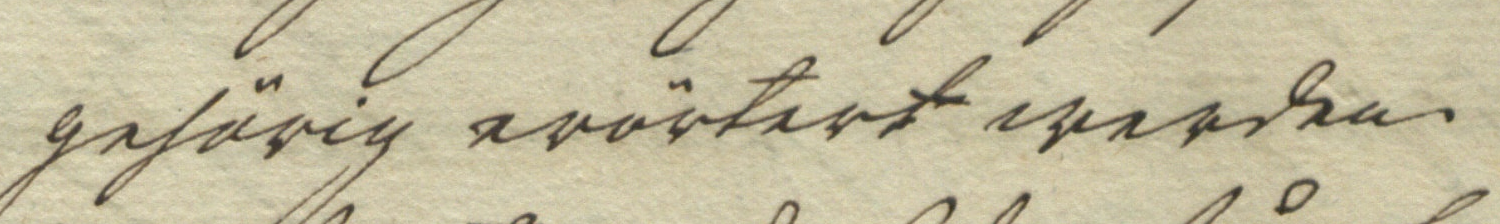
gehörig erörtert werden.
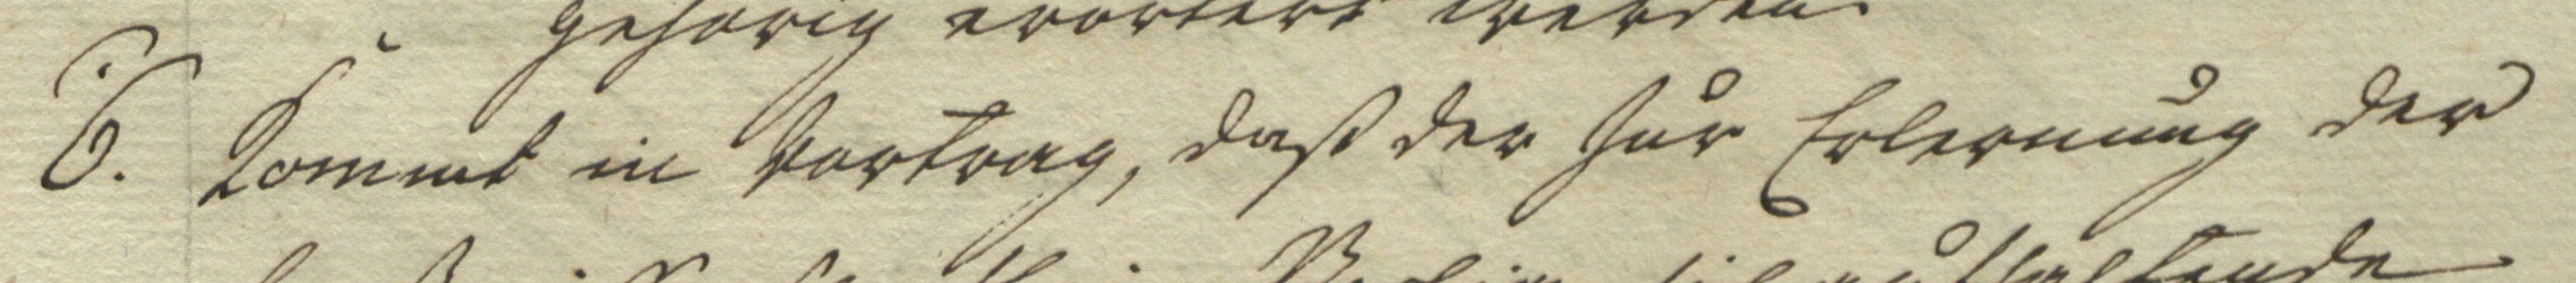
6. kommt in Vortrag, daß der zur Erlernung der
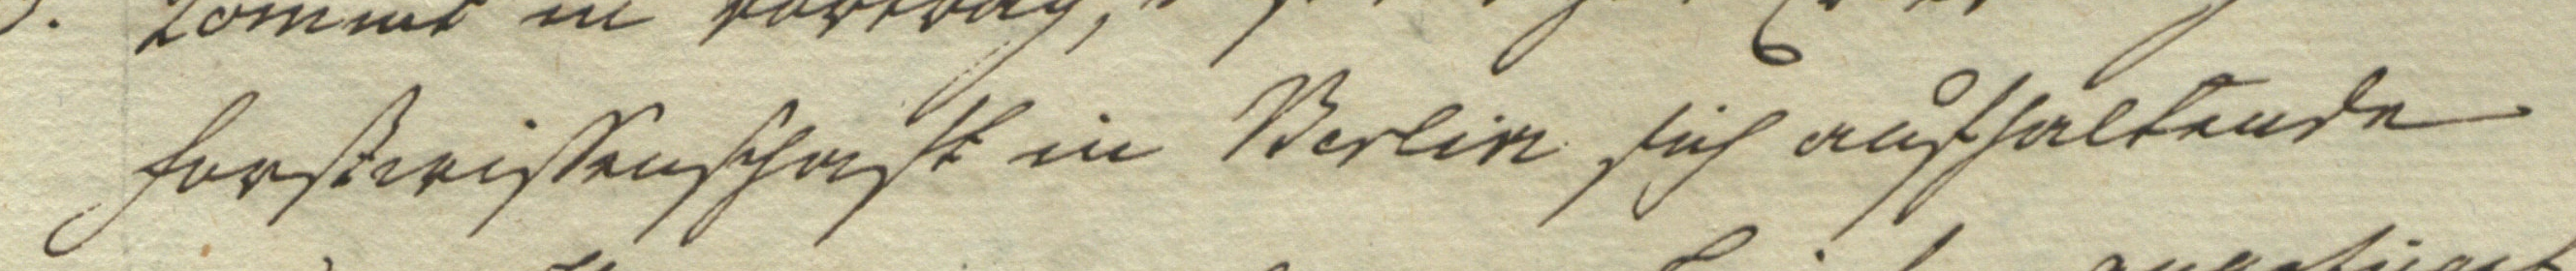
Forstwissenschaft in Berlin sich aufhaltende
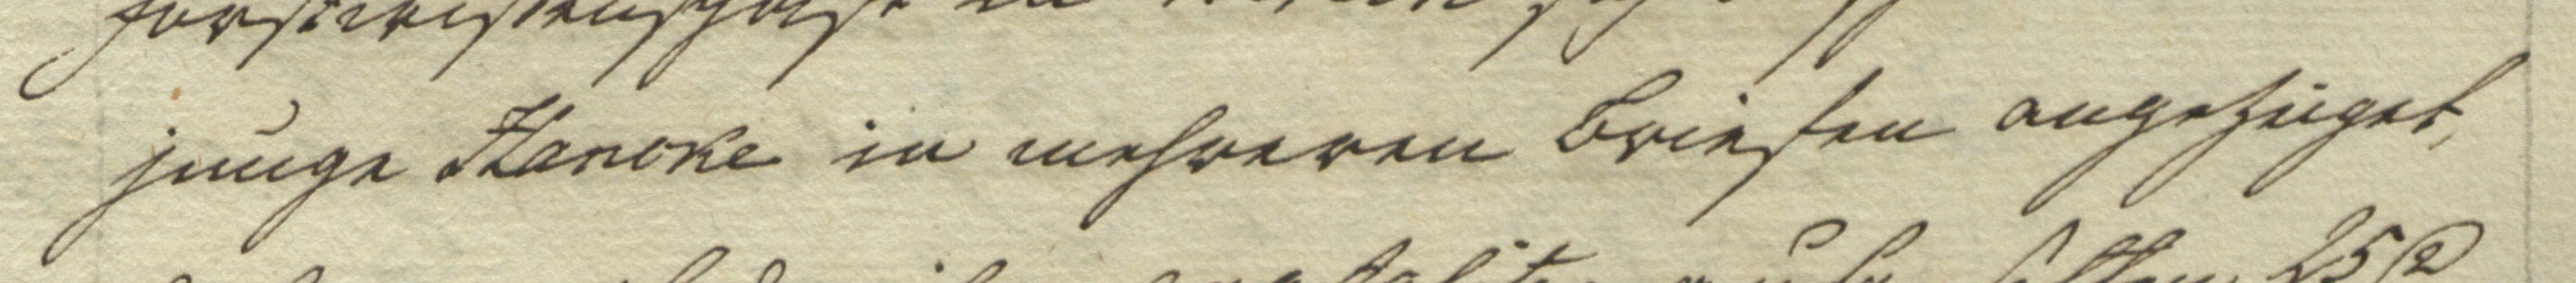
junge Hancke in mehreren Briefen angezeiget,
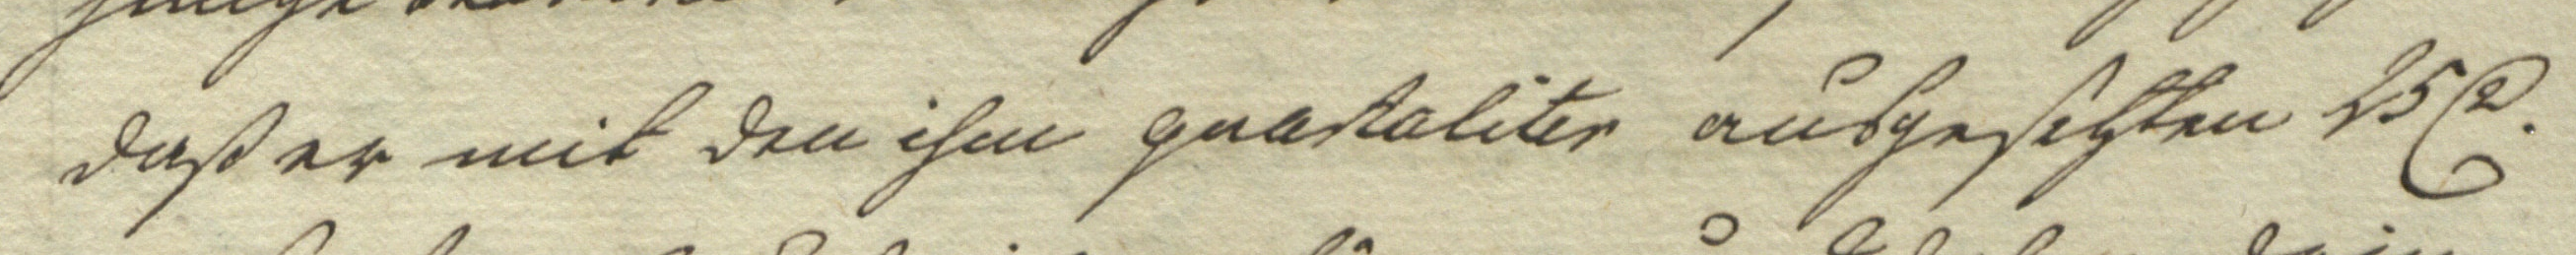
daß er mit den ihm quartaliter ausgesetzten 25 l.
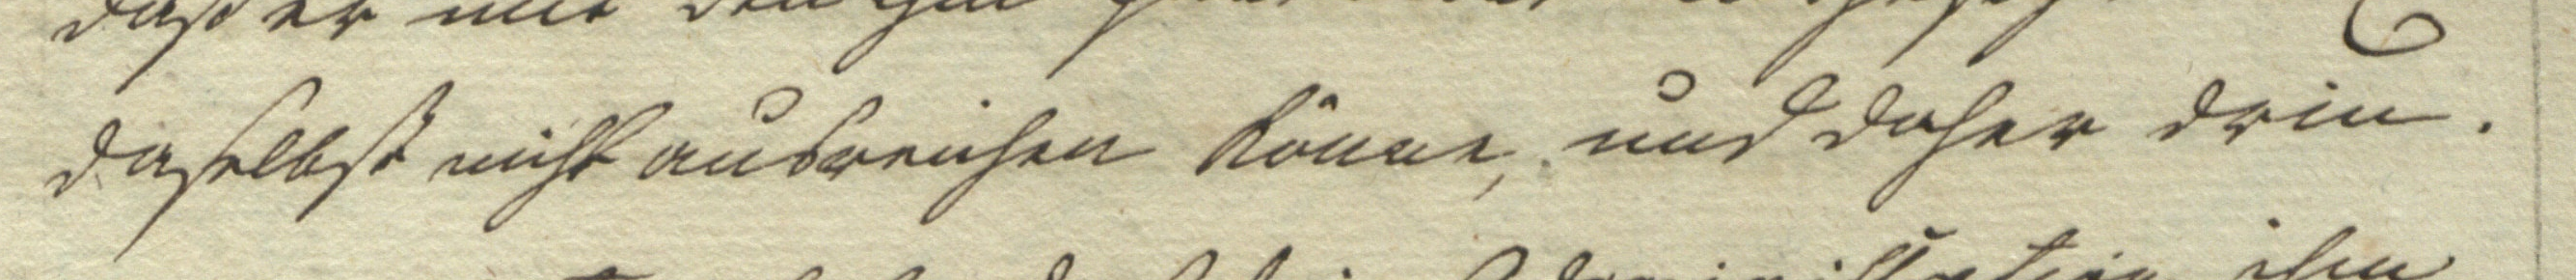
daselbst nicht ausreichen könne, und daher drin¬
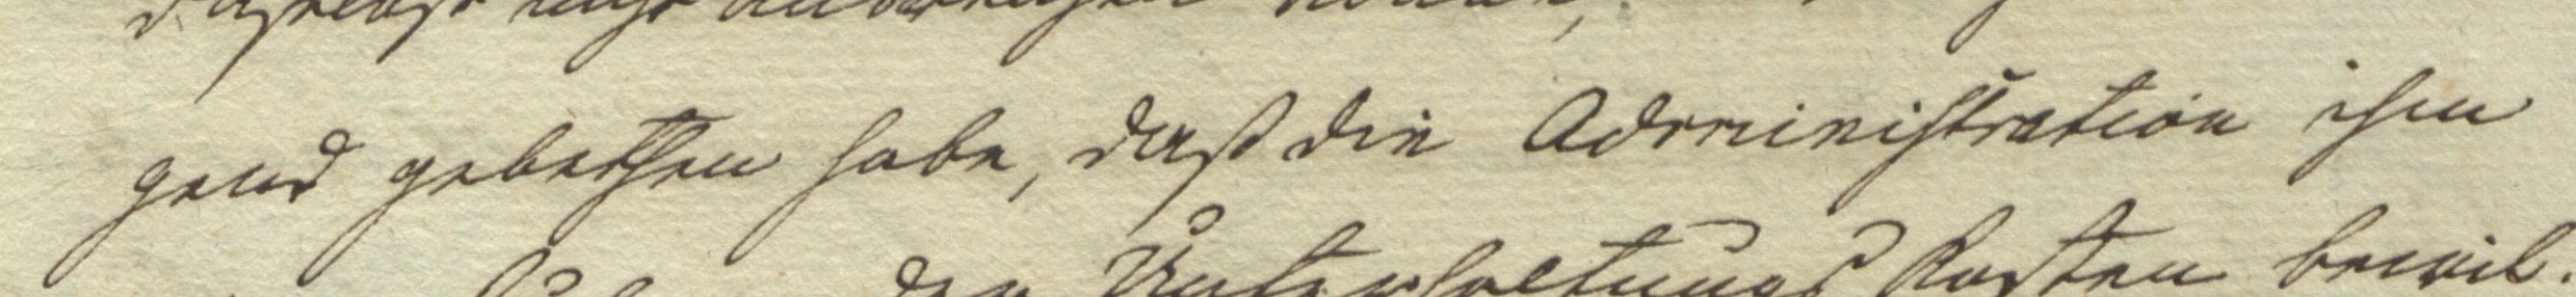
gend gebethen habe, daß die Administration ihm
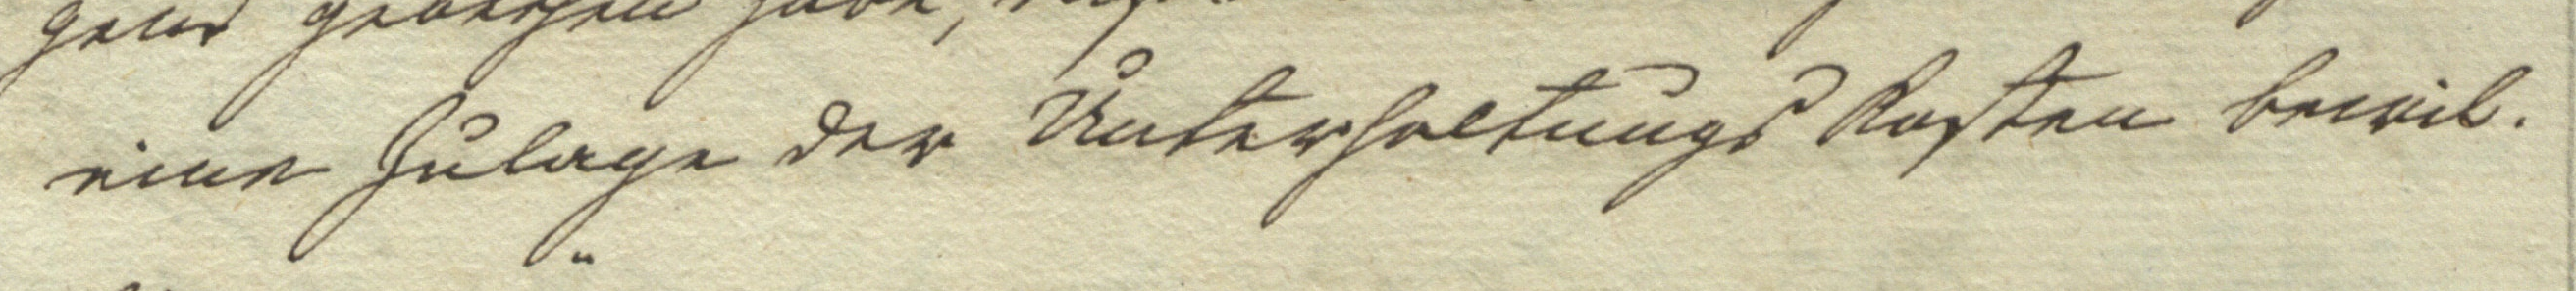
eine Zulage der Unterhaltungs Kosten bewil¬
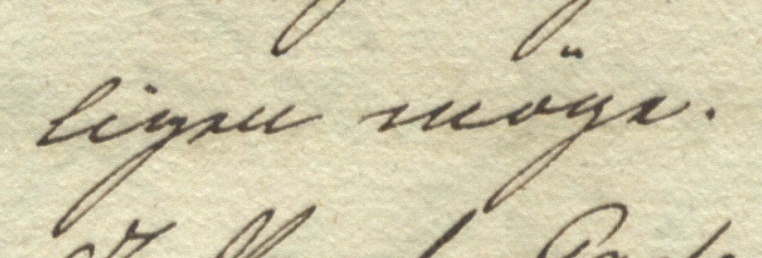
ligen möge.
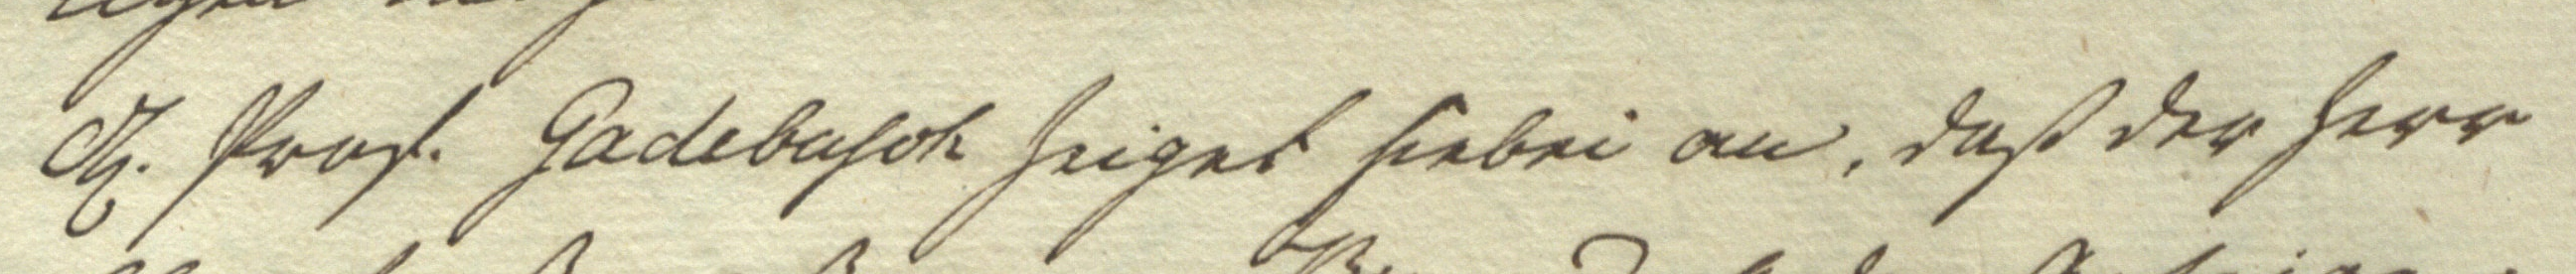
dh. Prof. Gadebusch zeiget hiebei an, daß der Herr
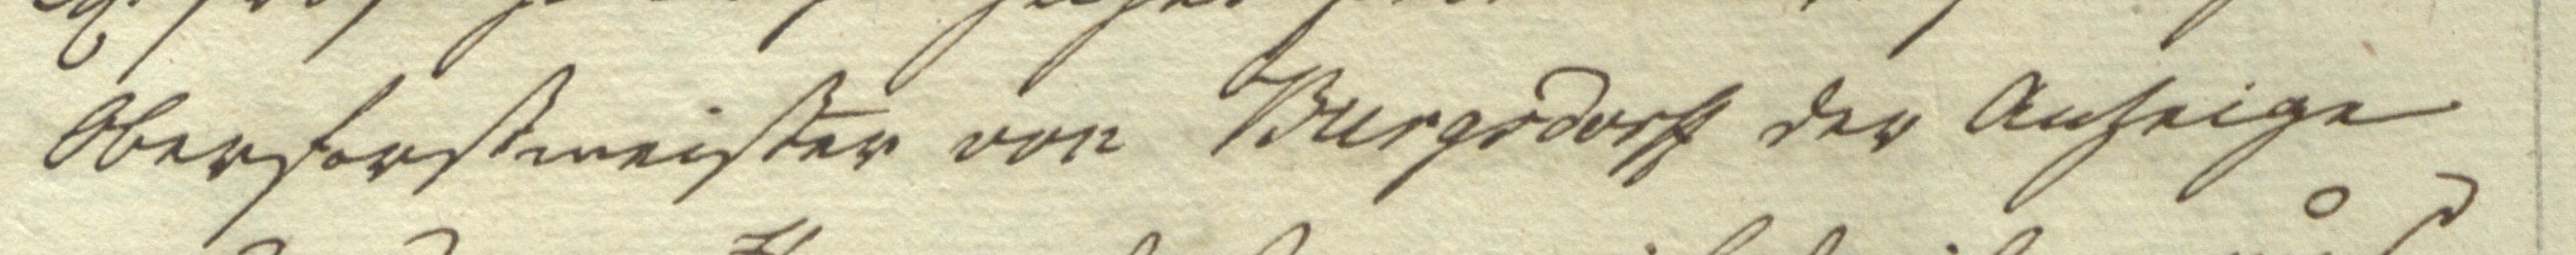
Oberforstmeister von Burgsdorff der Anzeige
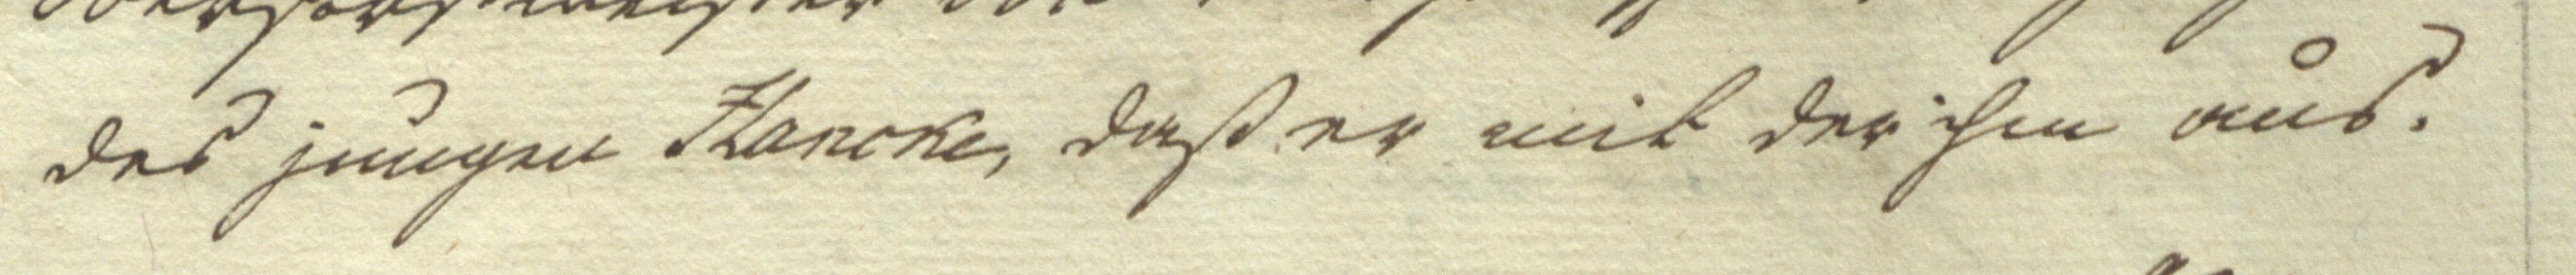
des jungen Hancke, daß er mit der ihm aus¬
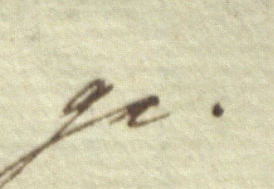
ge¬
